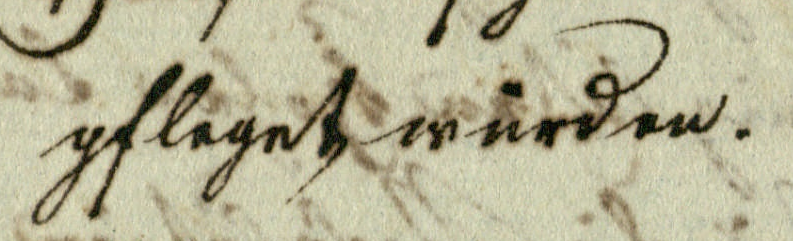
pfleget würden.
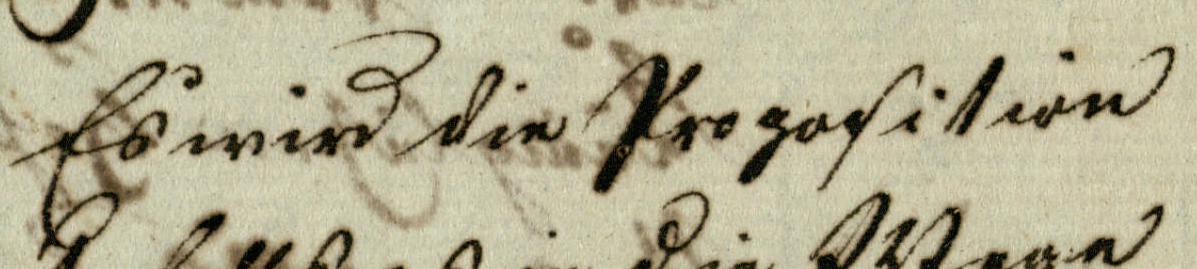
Es wird die Proposition
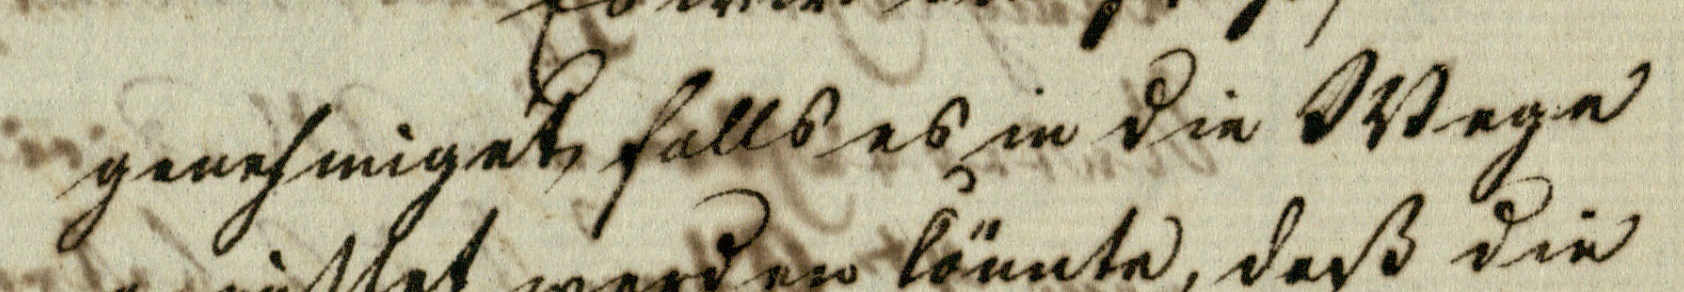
genehmiget falls es in die Wege
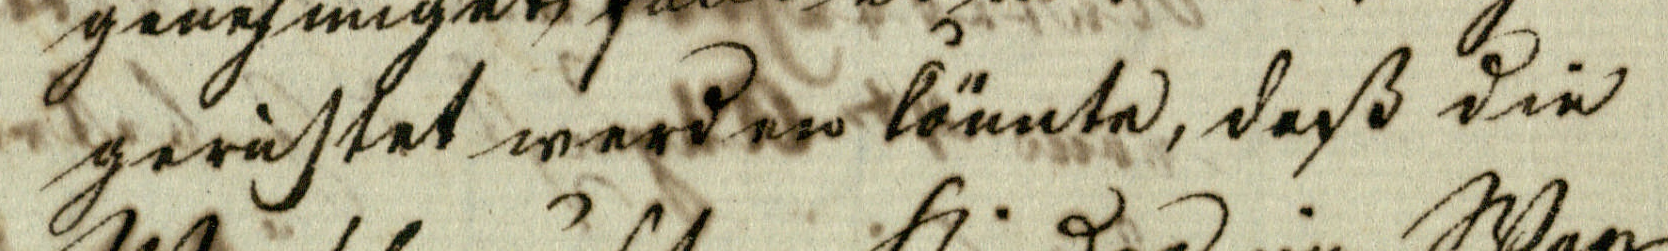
gerichtet werden könnte, daß die
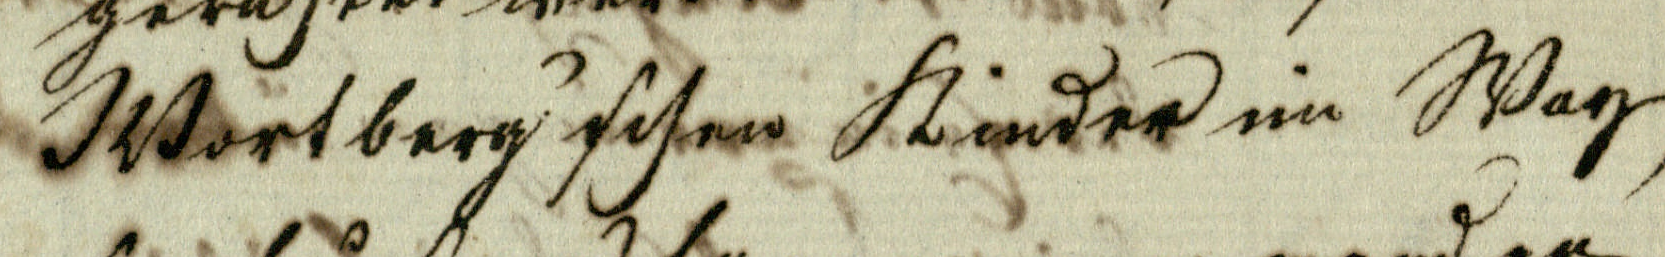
Wortberg'schen Kinder im Way¬
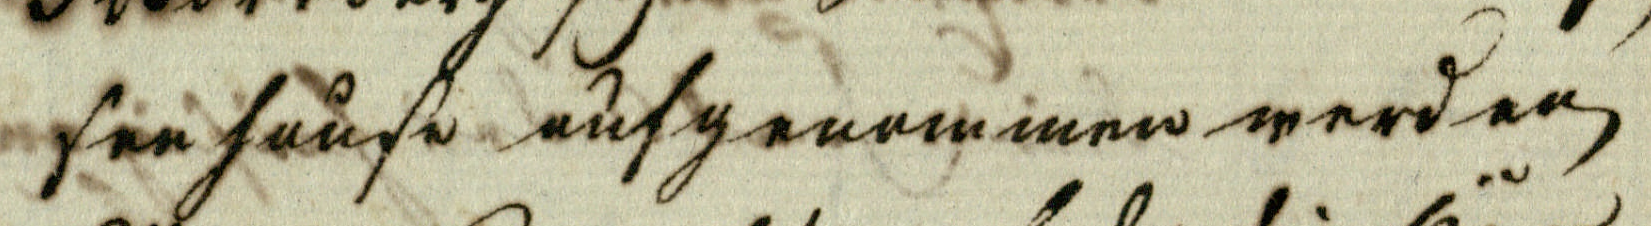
senhause aufgenommen werden
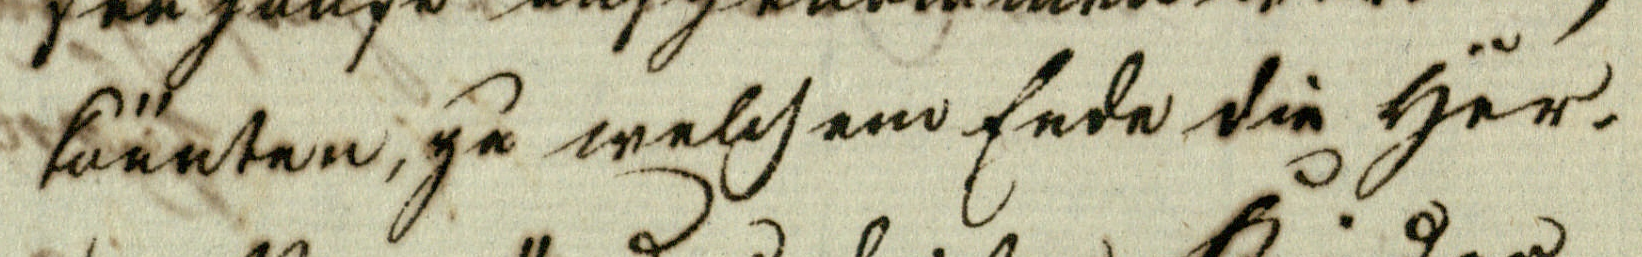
könnten, zu welchem Ende die Her¬
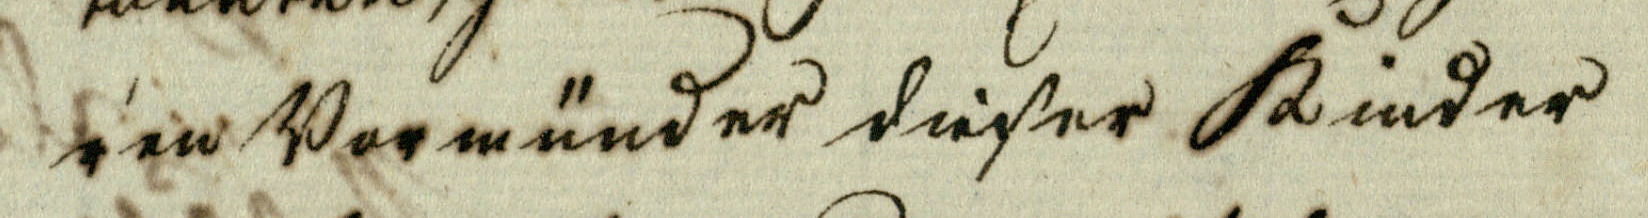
ren Vormünder dieser Kinder
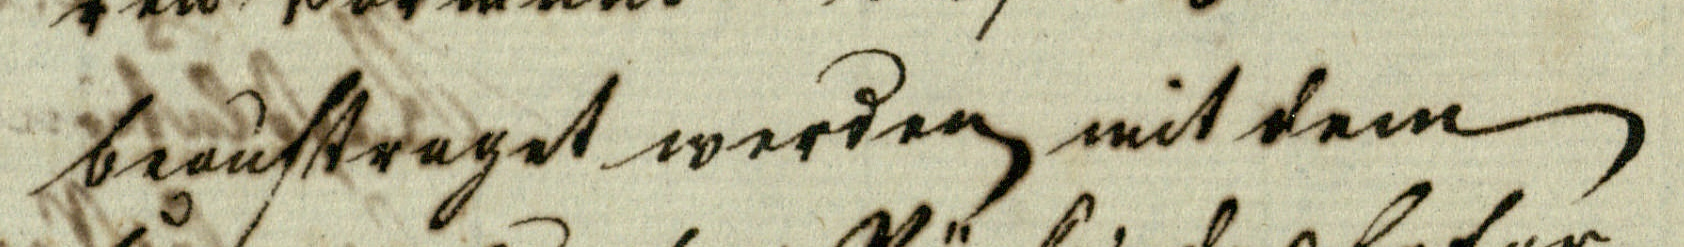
beauftraget werden, mit dem
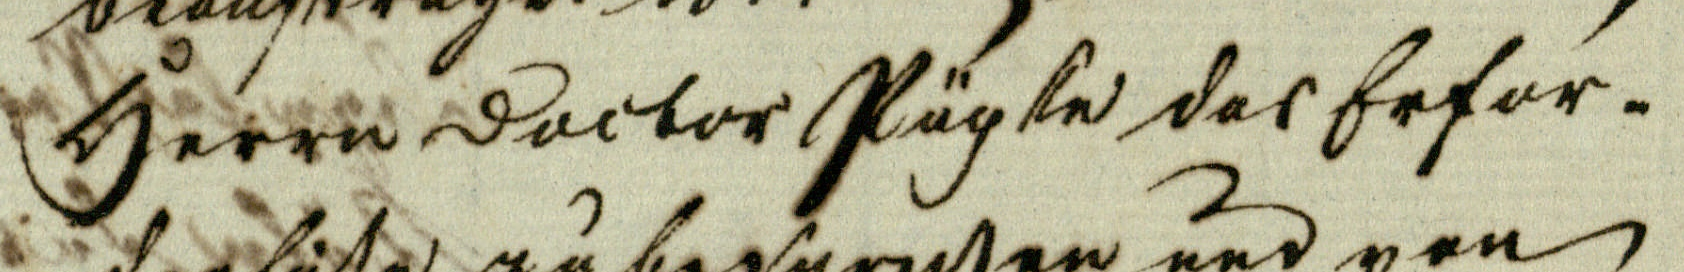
Herrn Doctor Päpke das Erfor¬
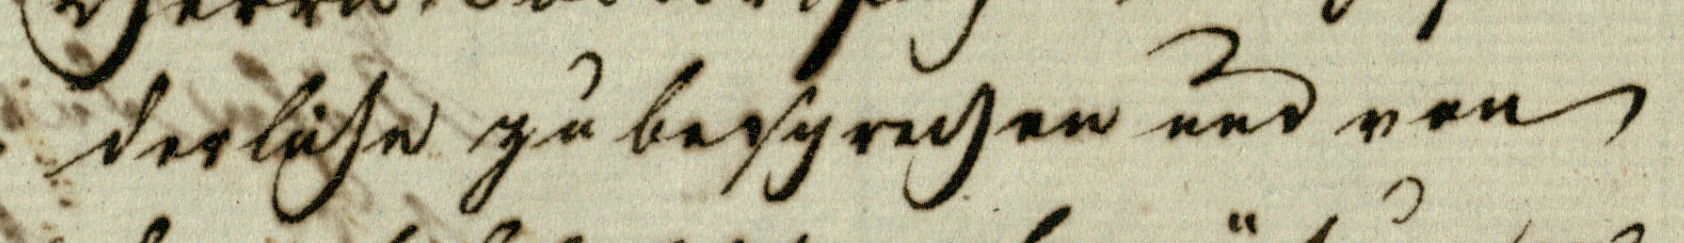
derliche zu besprechen und von
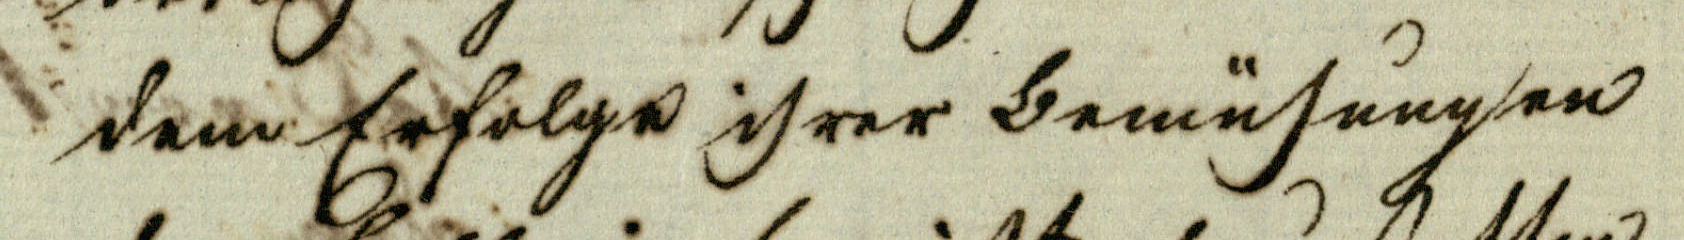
dem Erfolge ihrer Bemühungen
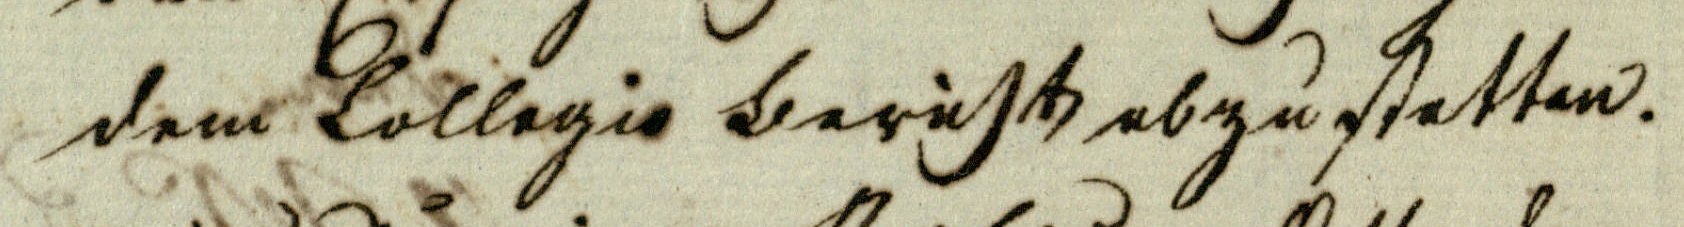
dem Collegio Bericht abzustatten.
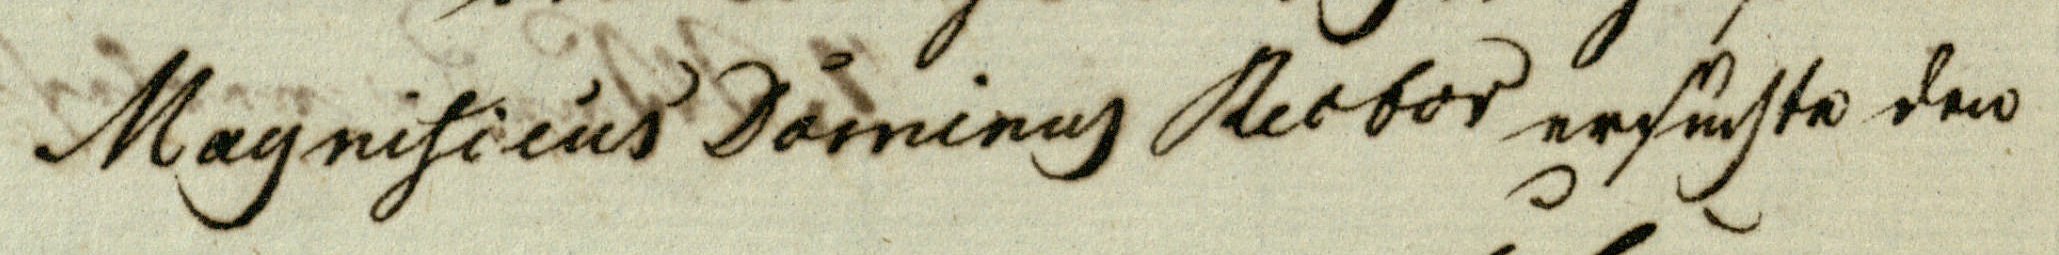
Magnificus Dominus Rector ersuchte den
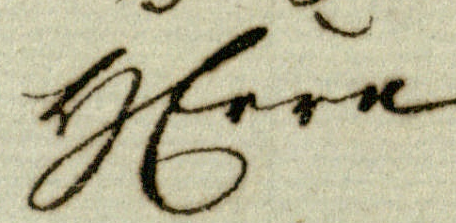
Herrn
